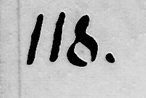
1645.
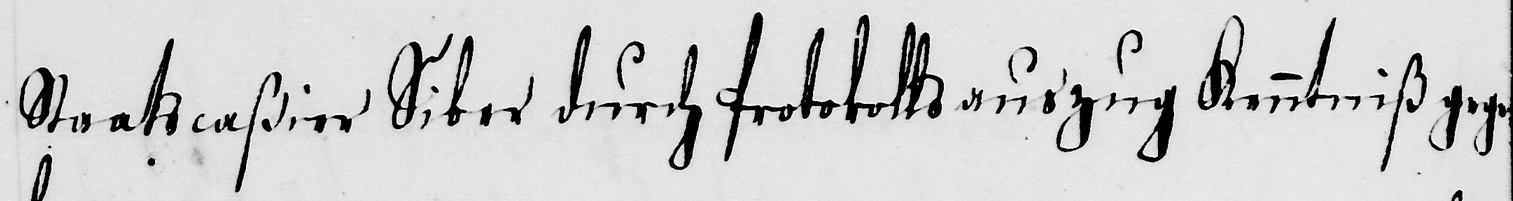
Staatscaßier Siber durch Protokollsauszug Kenntniß geg¬
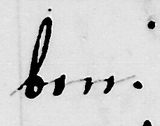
eben.
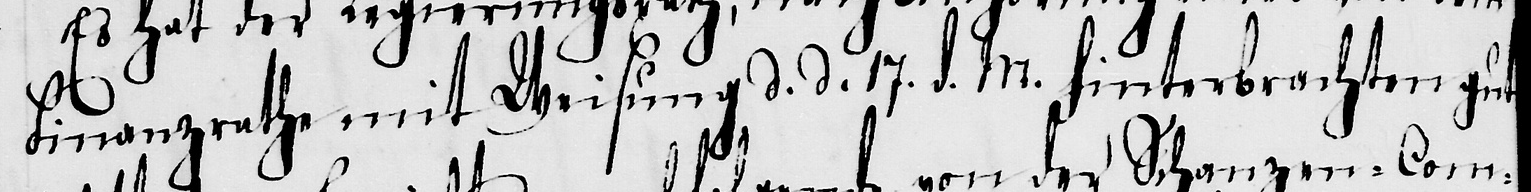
Finanzrathe mit Weisung d. d. 17. d. M. hinterbrachten gut¬
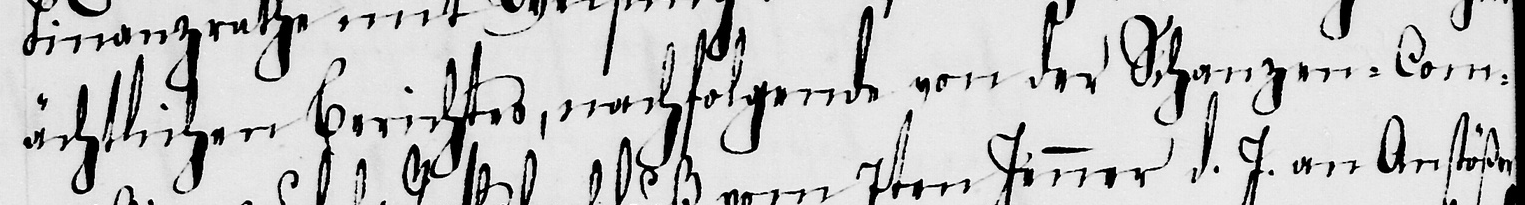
ächtlichen Berichtes, nachfolgendes von der Schanzen- Com¬
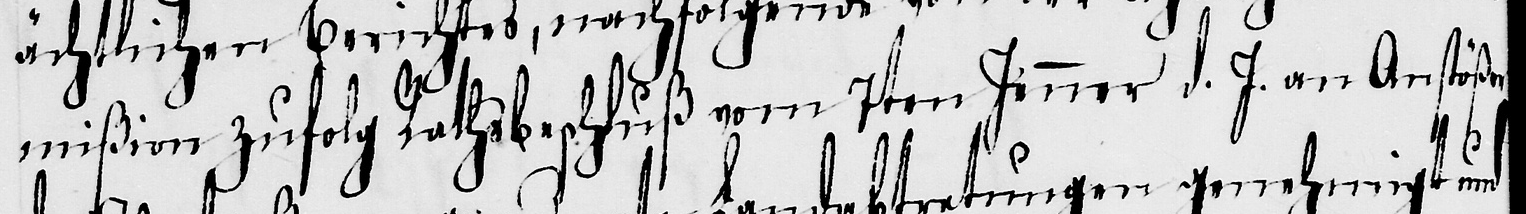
mißion zufolg Rathsbeschluß vom 7ten Jenner d. J. an Anstößer
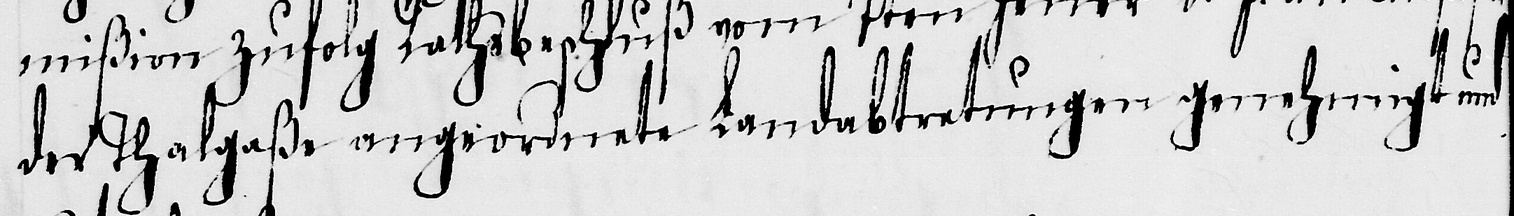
der Thalgaße angeordnete Landabtretungen genehmigt und
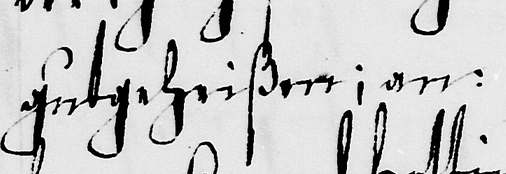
gutgeheißen; an:
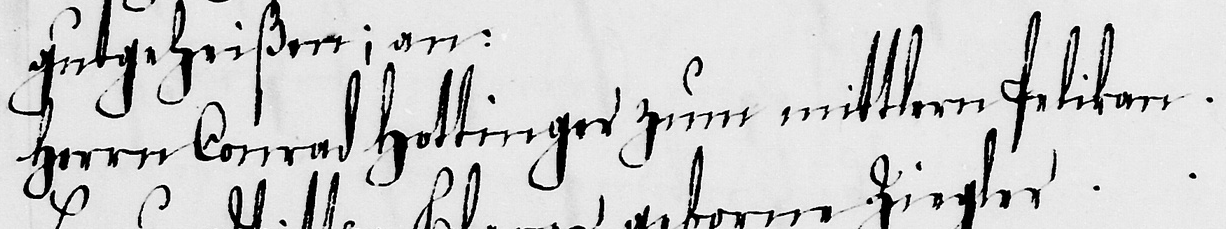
Herrn Conrad Hottinger zum mittlern Pelikan
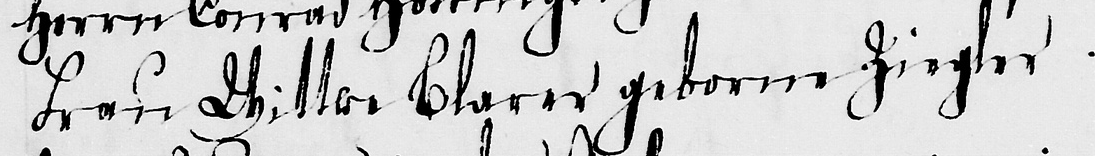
Frau Wittwe Blarer geborne Ziegler
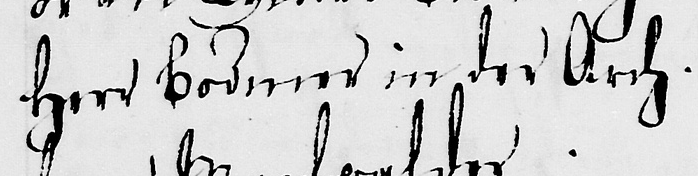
Herr Bodmer in der Arch
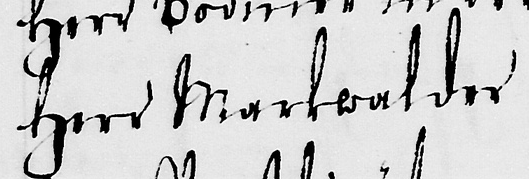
Herr Markwalder
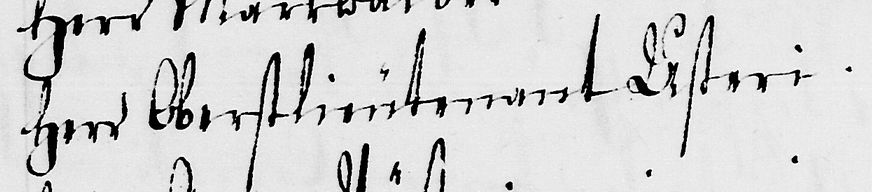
Herr Oberstlieutenant Usteri
